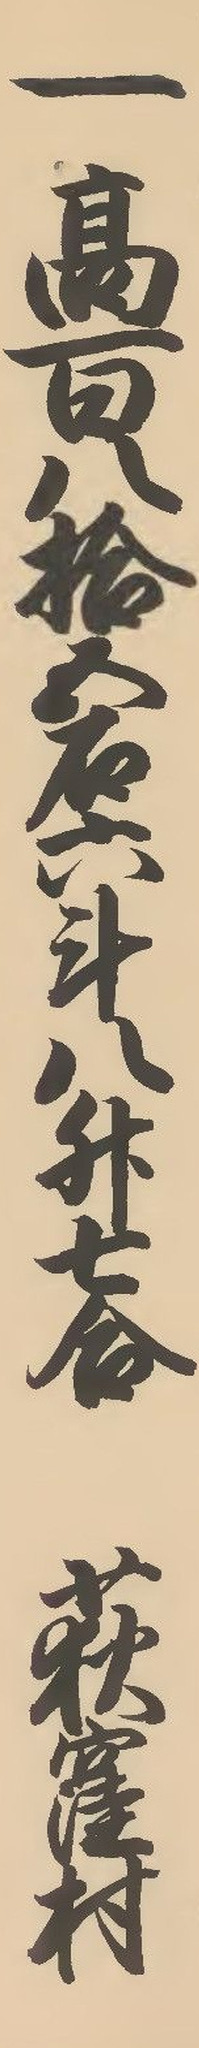一髙百八拾五石六斗八升七合荻窪村
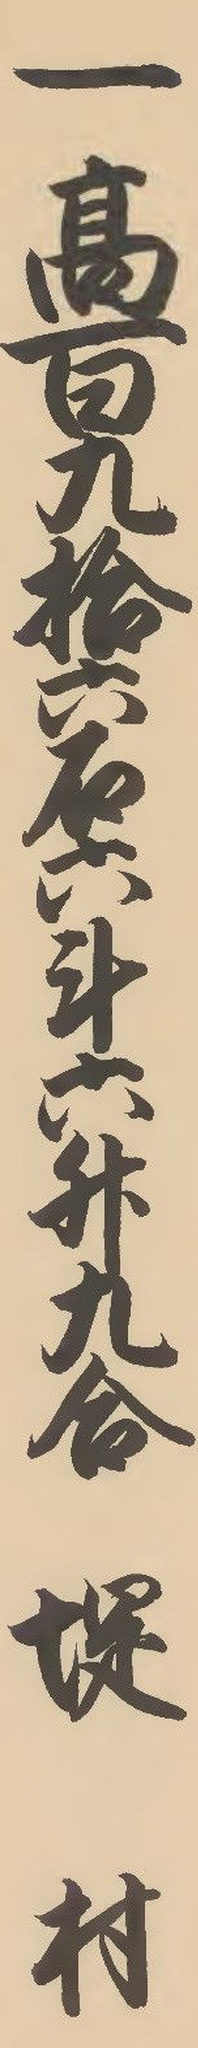一髙百九拾六石六斗六升九合堤村
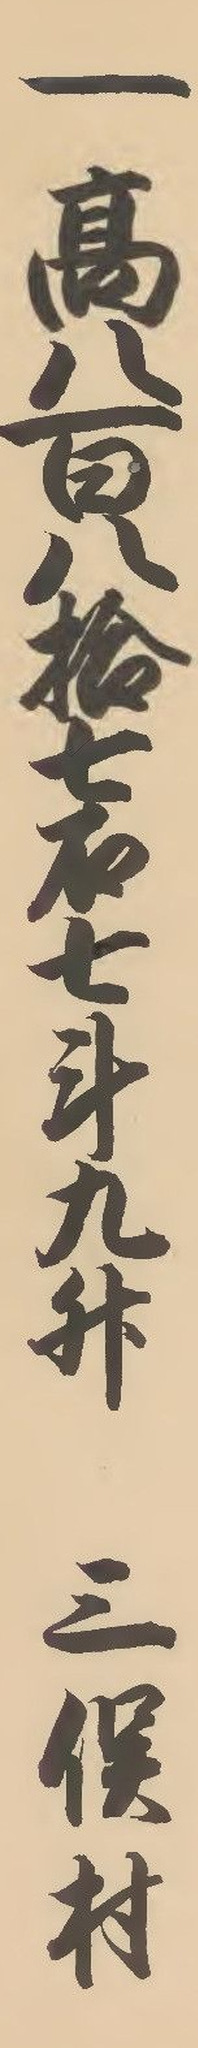一髙八百八拾七石七斗九升三俣村

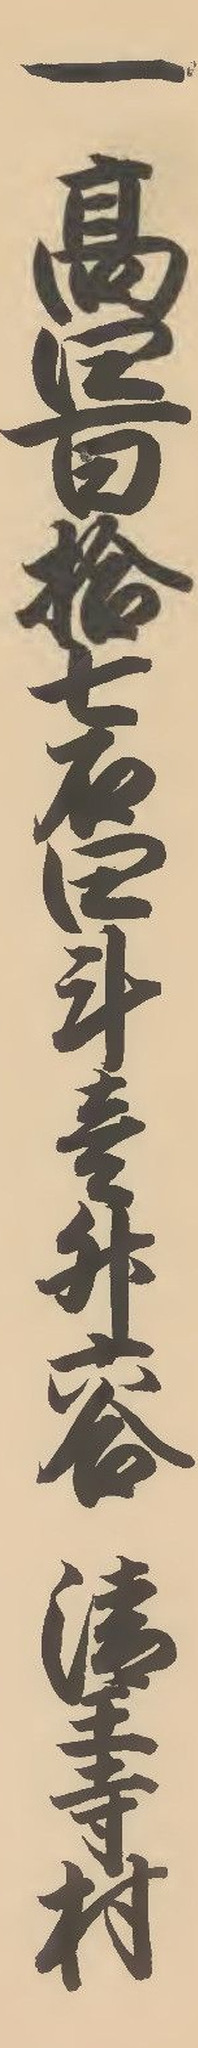一髙四百拾七石四斗壱升六合清王寺村
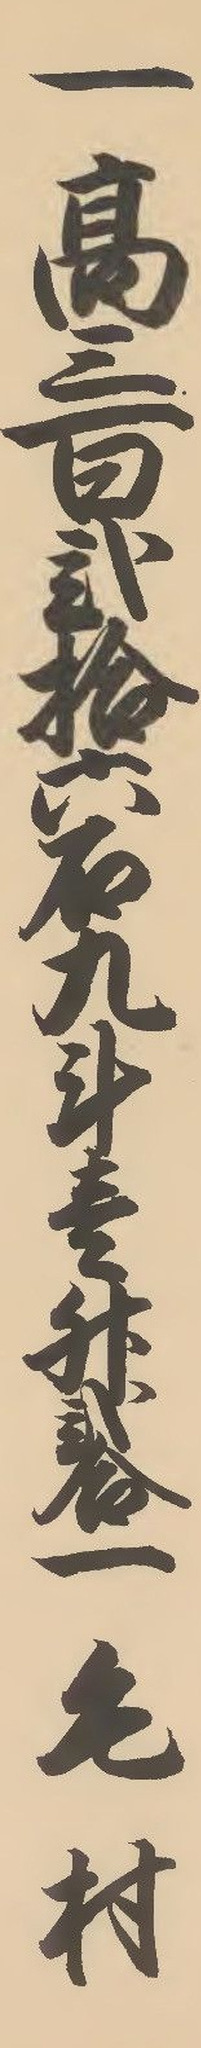一髙三百弐拾六石九斗壱升弐合一毛村
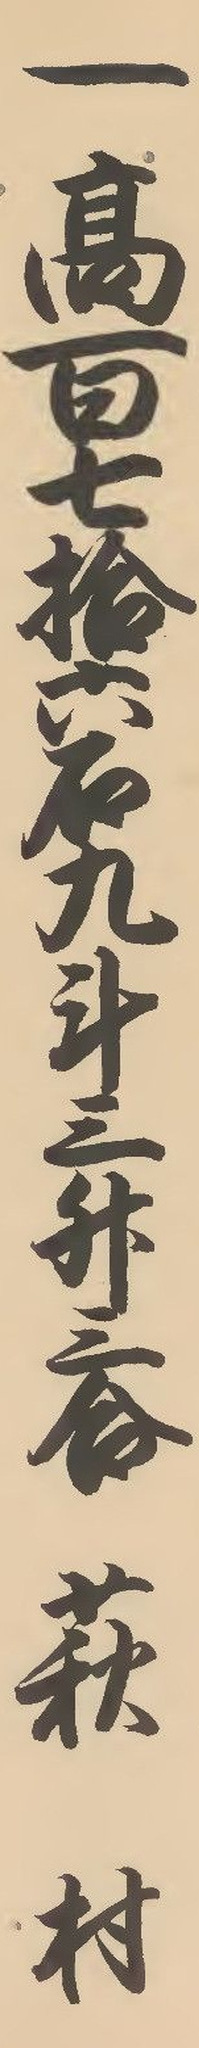一髙百七拾六石九斗三升三合萩村
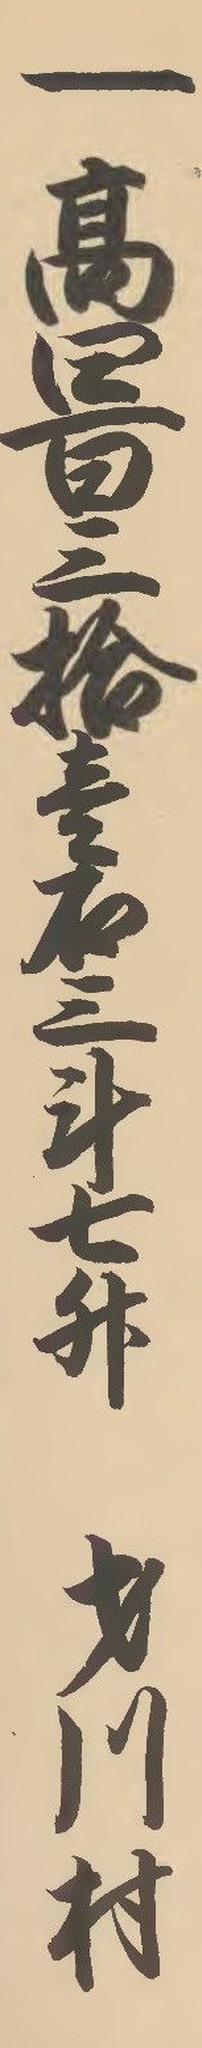一髙四百三拾壱石三斗七升才川村
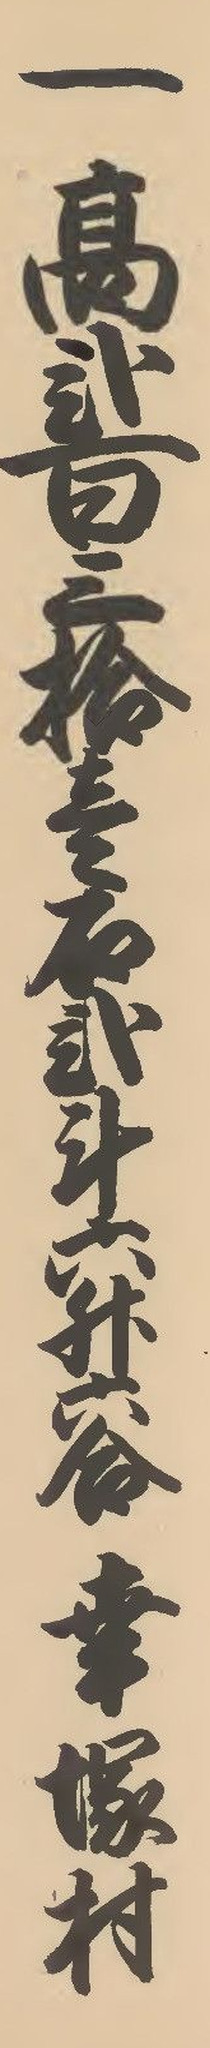一髙弐百三拾壱石弐斗六升六合幸塚村
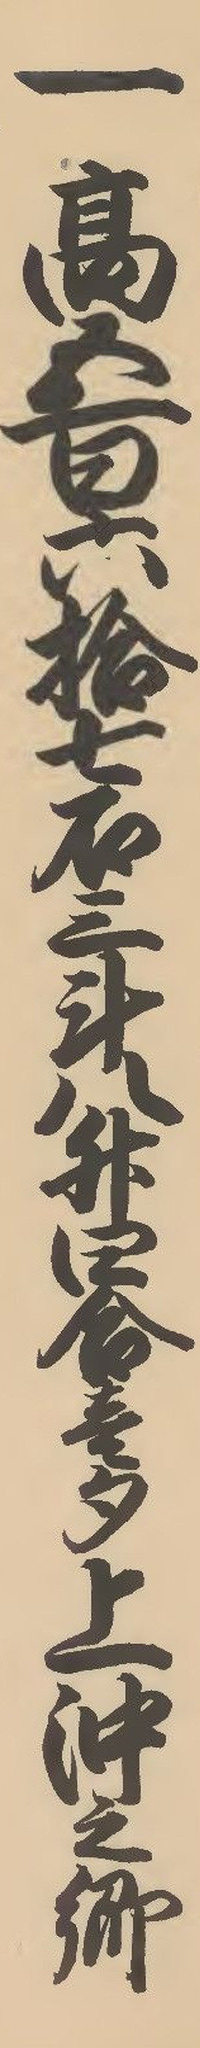一髙五百六拾七石三斗八升四合壱夕上沖之郷
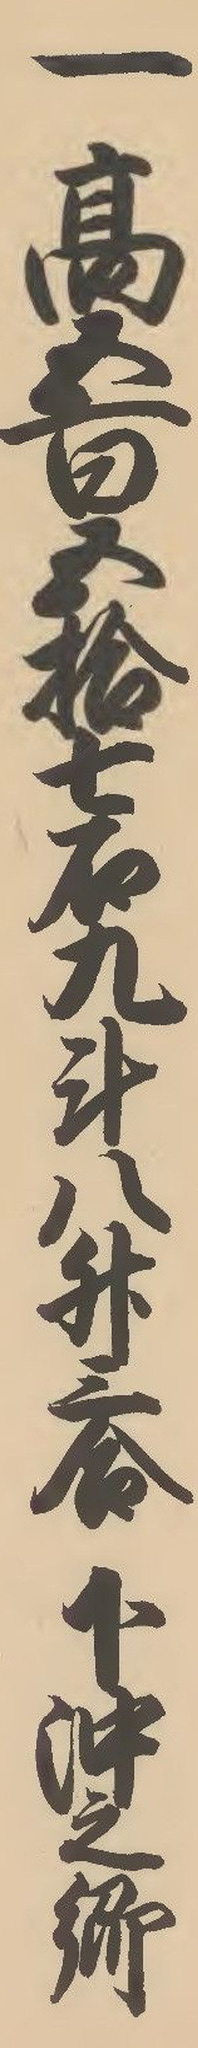一髙五百五拾七石九斗八升三合下沖之郷
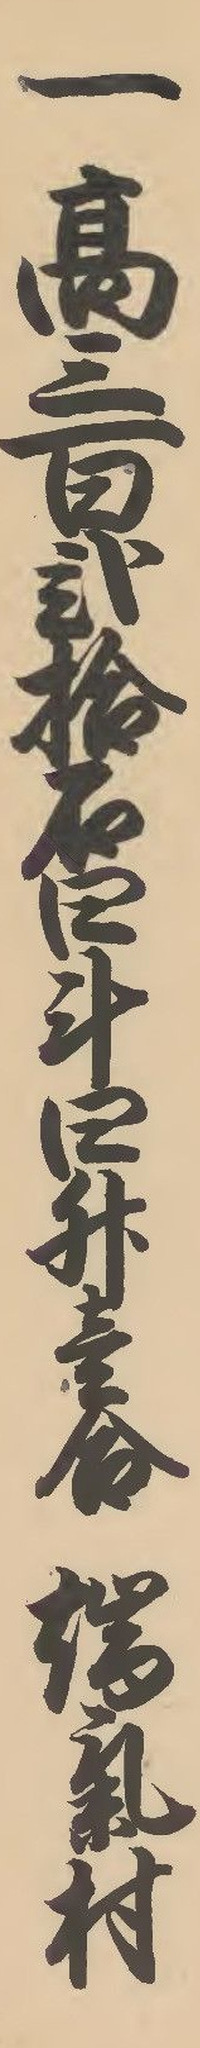一髙三百弐拾石四斗四升壱合端氣村

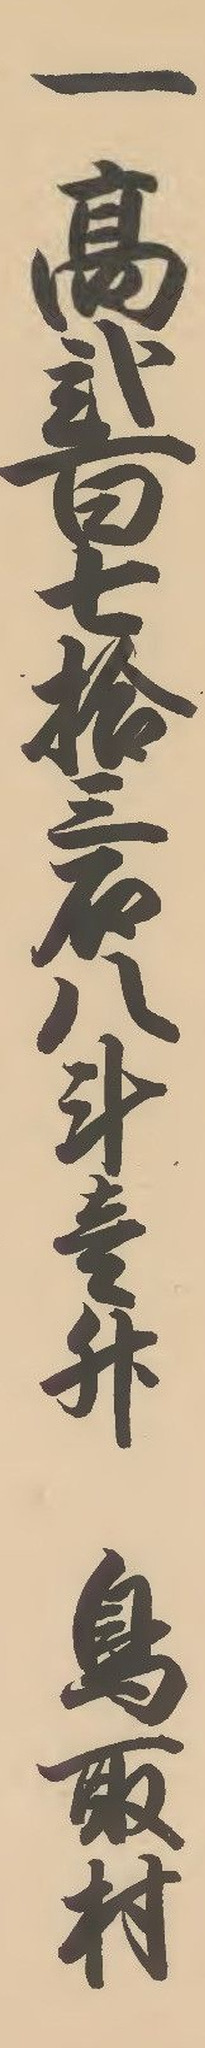一髙弐百七拾三石八斗壱升鳥取村
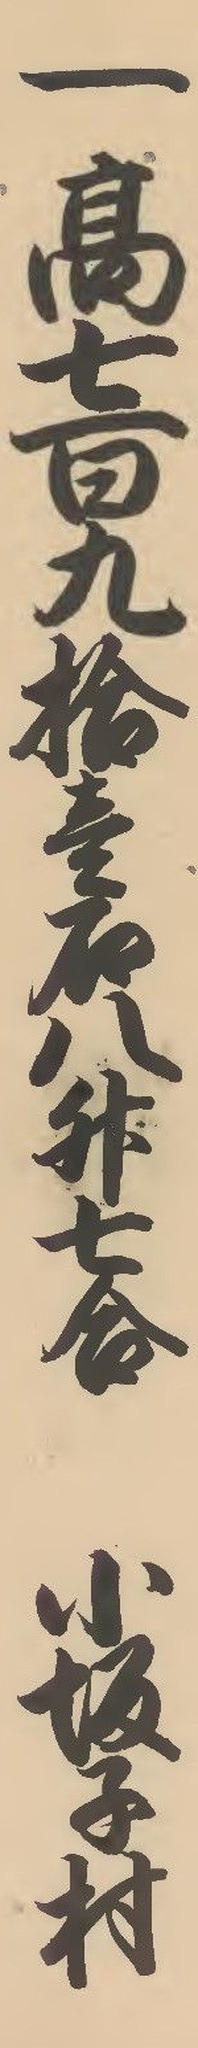一髙七百九拾壱石八升七合小坂子村
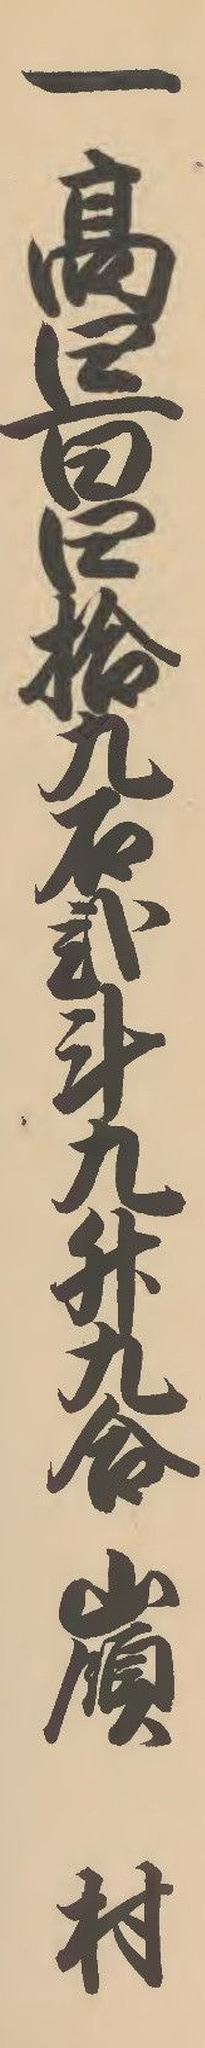一髙四百四拾九石弐斗九升九合嶺村
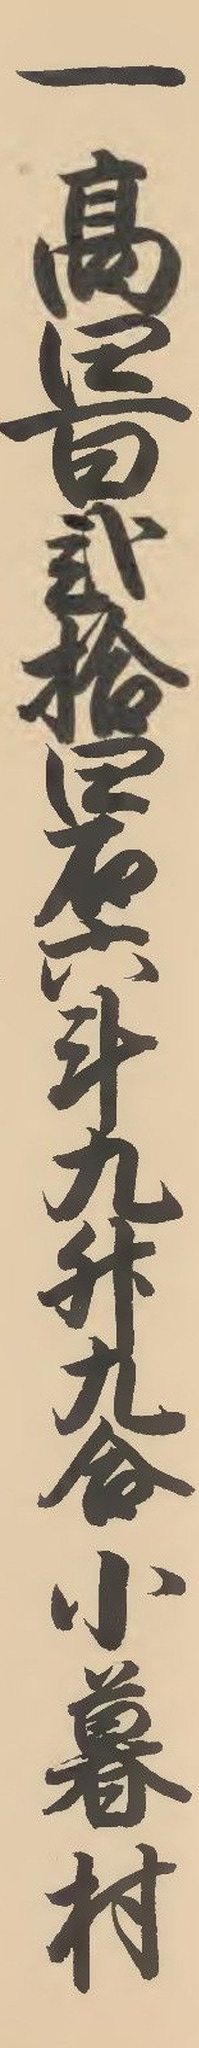一髙四百弐拾四石六斗九升九合小暮村
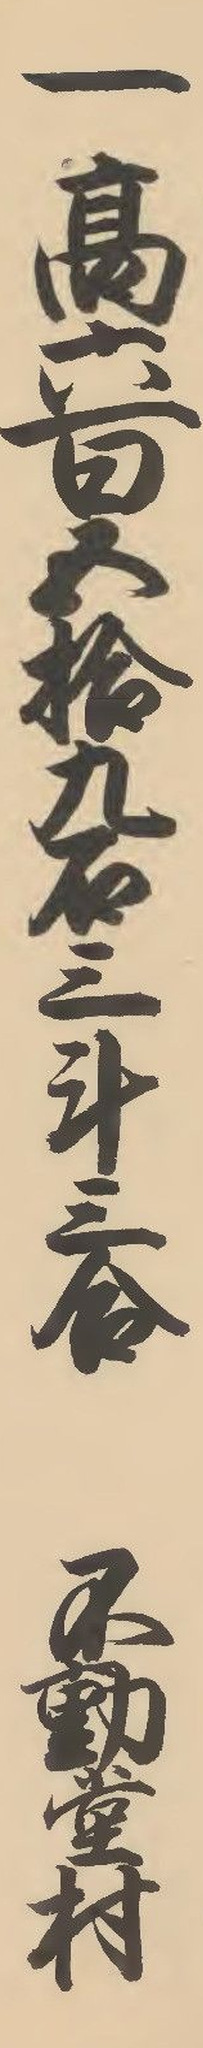一髙六百五拾九石三斗三合不動堂村
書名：上野国郷帳
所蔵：国立公文書館 National Archives of Japan
